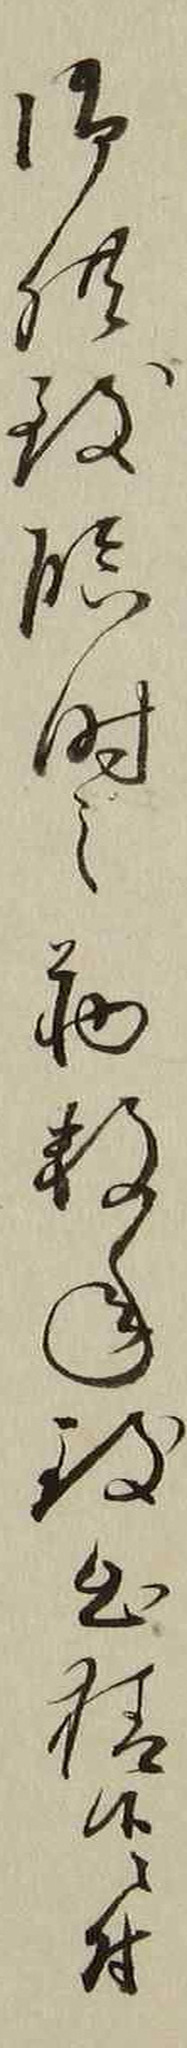御供致臨時の勤数年致出精候に付
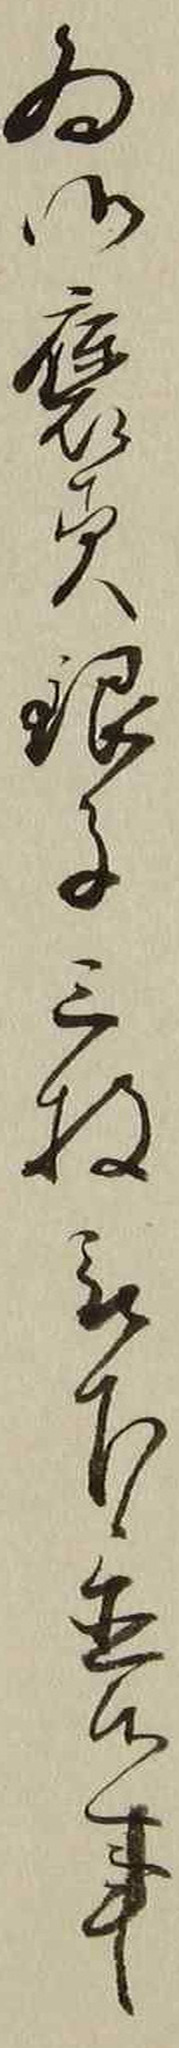為御褒の銀子三枚被下置候事
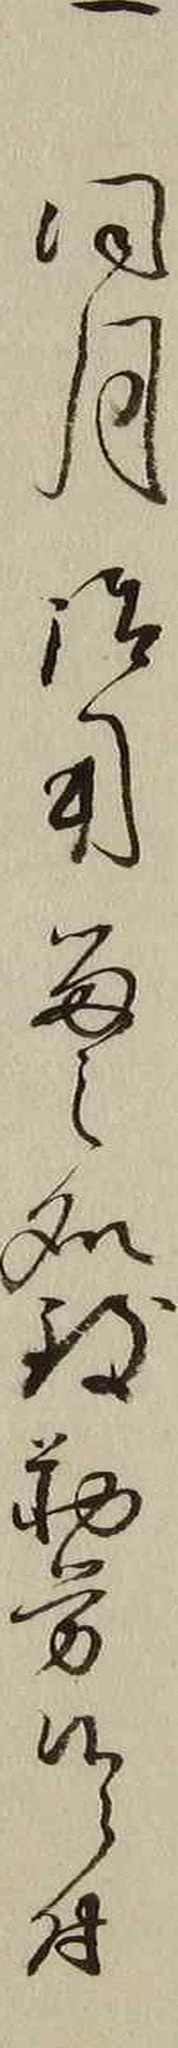一同月御用留の処致勤労候に付
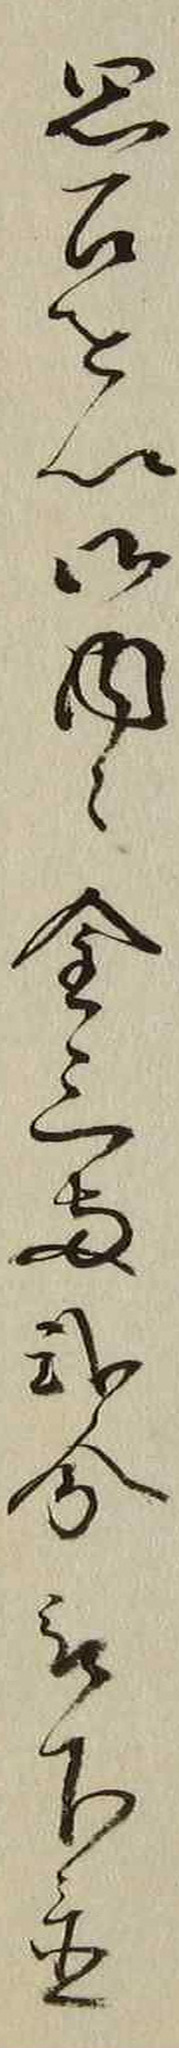思召を以御内々金三両弐分被下置
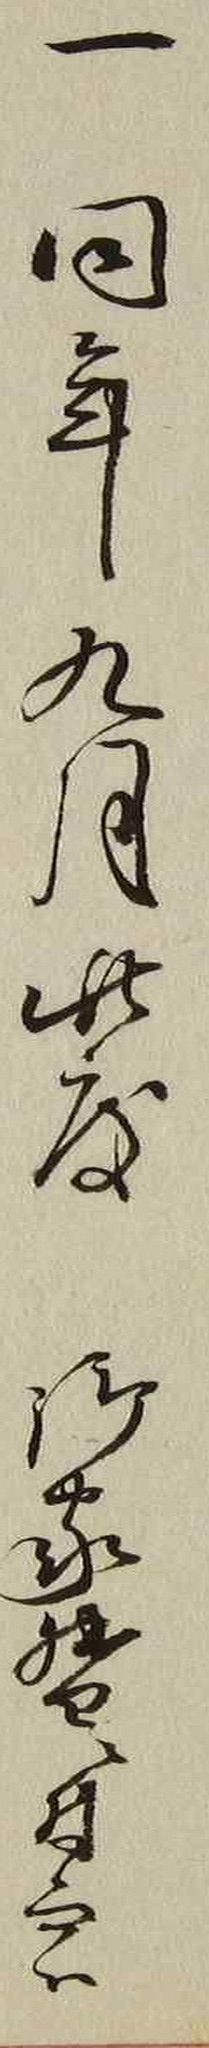一同年九月此度御家督に付而は
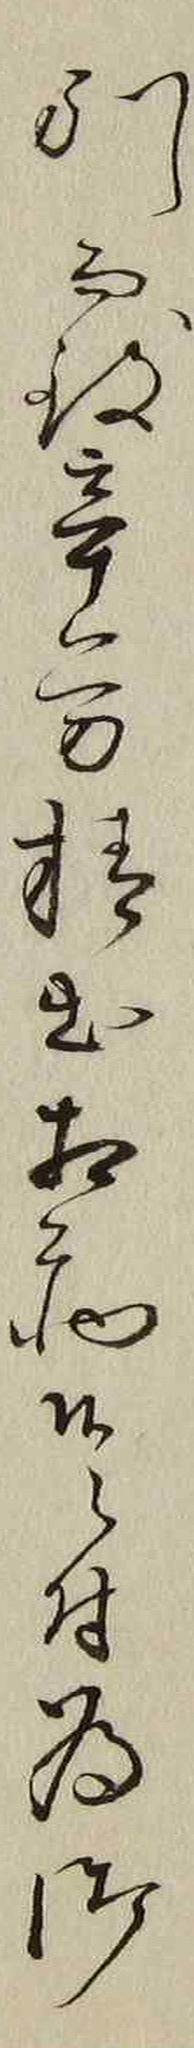別而致辛労精出相勤候に付為御
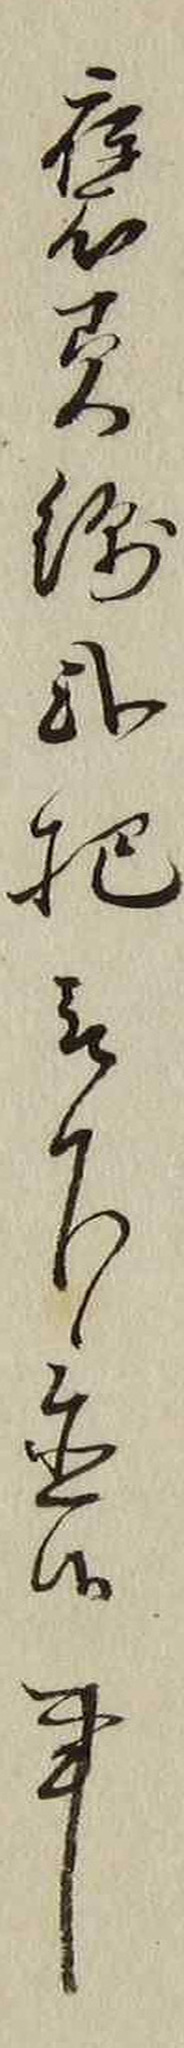褒美綿弐把被下置候事
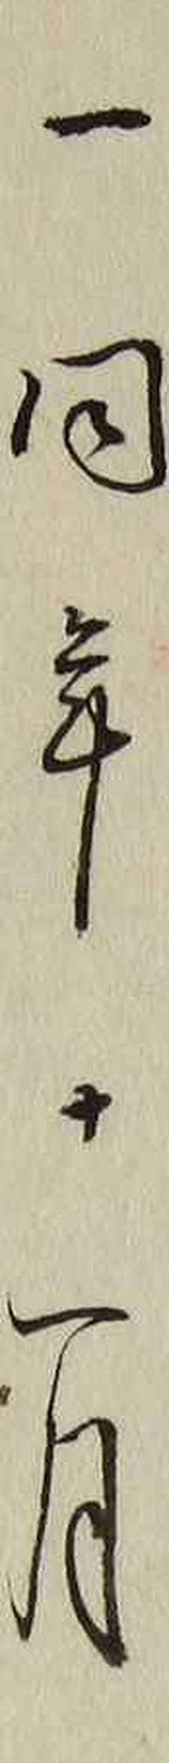一同年十一月
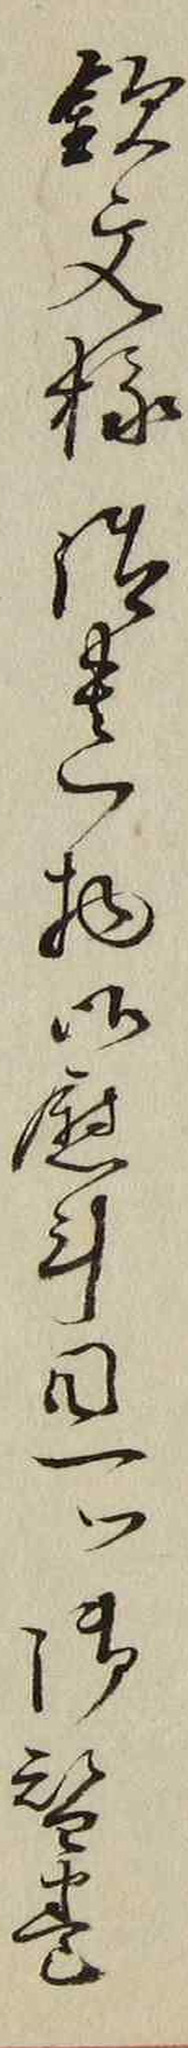欽文様御遣物慰斗目一ツ御替巻
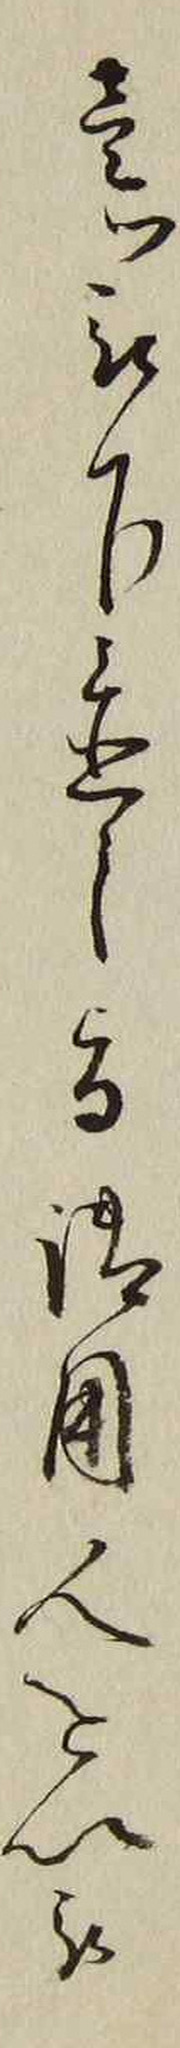壱ツ被下置の旨御用人を以被
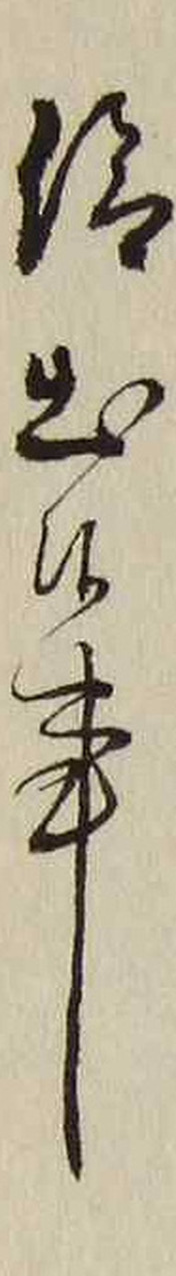仰出候事

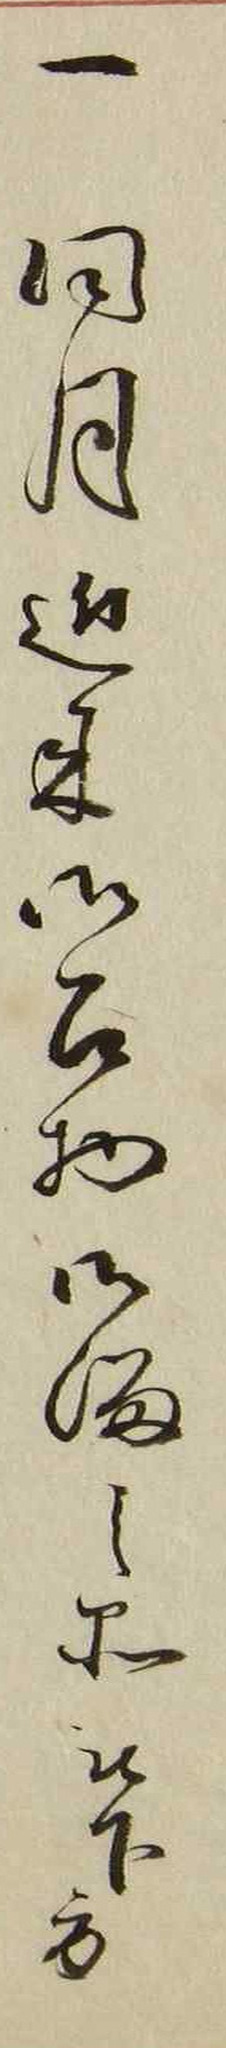一同月近来御召物御溜の品被下方
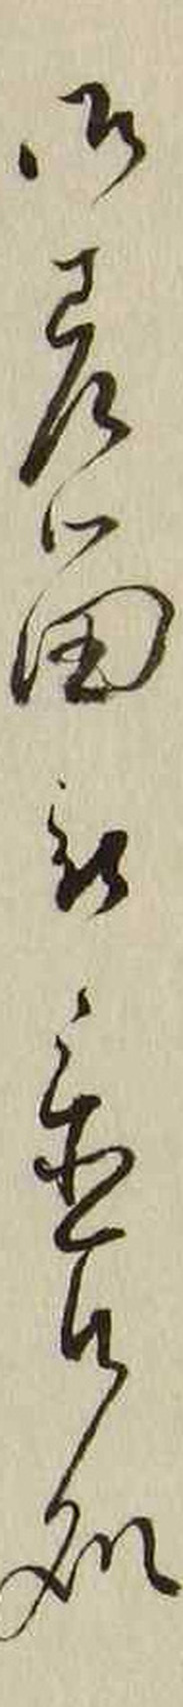御差留被置候処
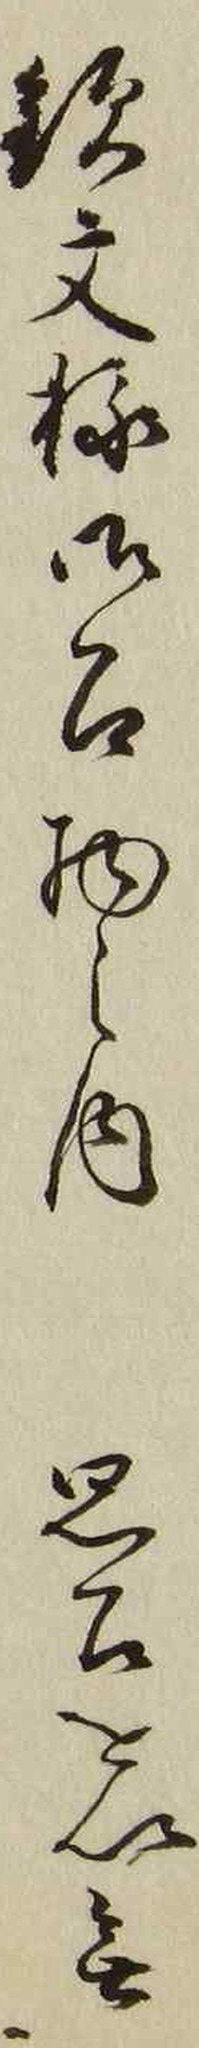欽文様御召物之内思召を以無
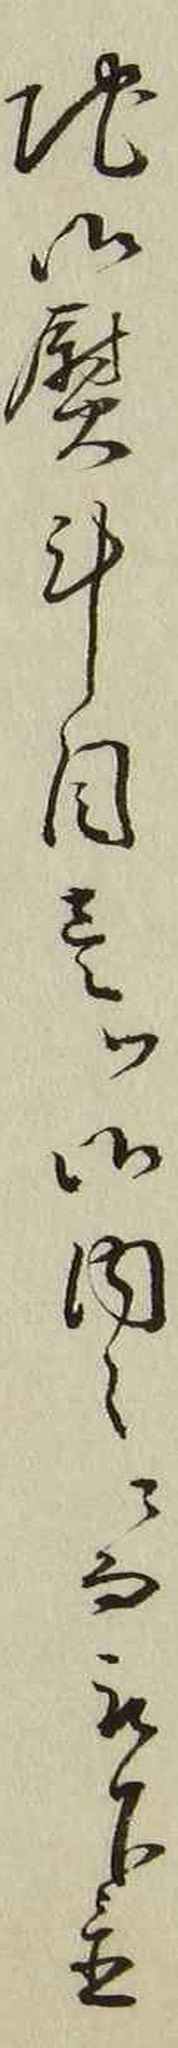地御熨斗目壱ツ御内々に而被下置
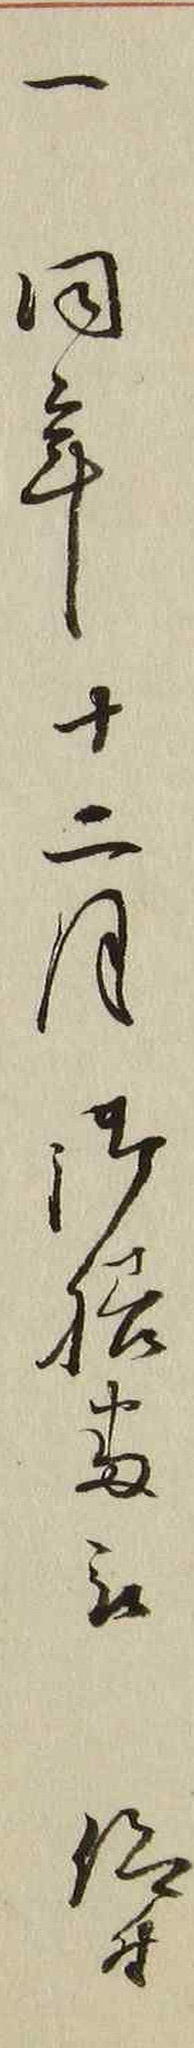一同年十二月御膳番被仰付
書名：諸士系譜　巻之1　い之部1
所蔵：会津若松市立会津図書館
